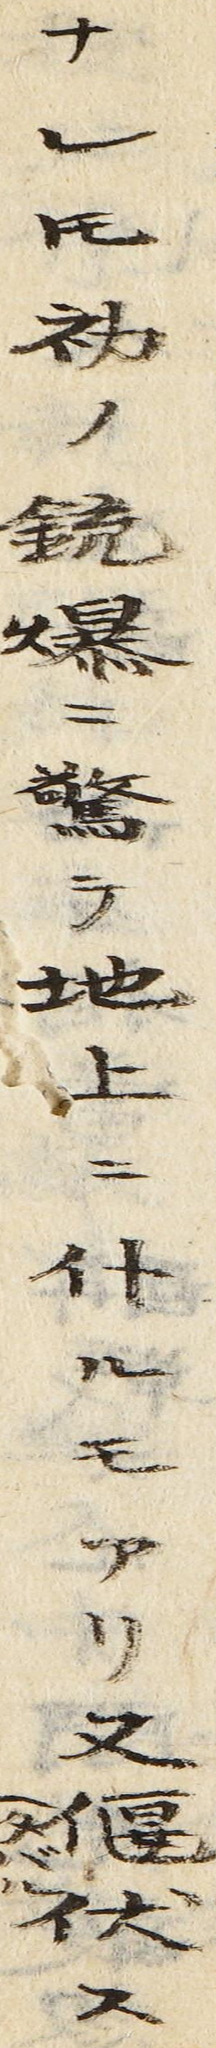ナレトモ初ノ銃爆ニ驚テ地上ニ仆ルモアリ又偃伏ス
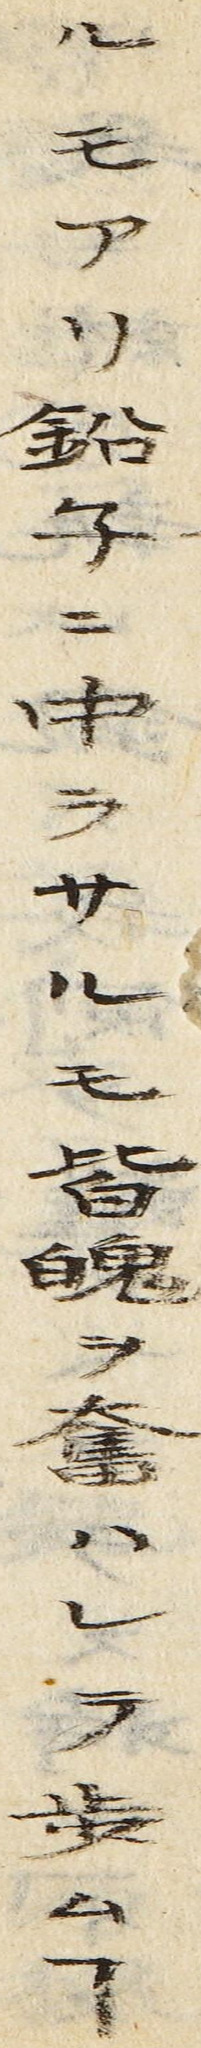ルモアリ鉛子ニ中ラサルモ皆魄ヲ奮ハレテ歩ムコト
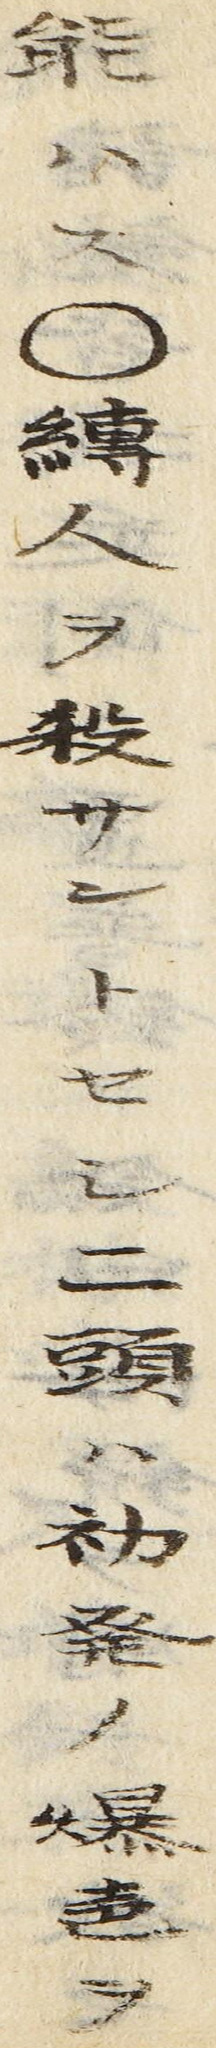能ハス◯縛人ヲ殺サントセシ二頭ハ初発ノ爆声ヲ
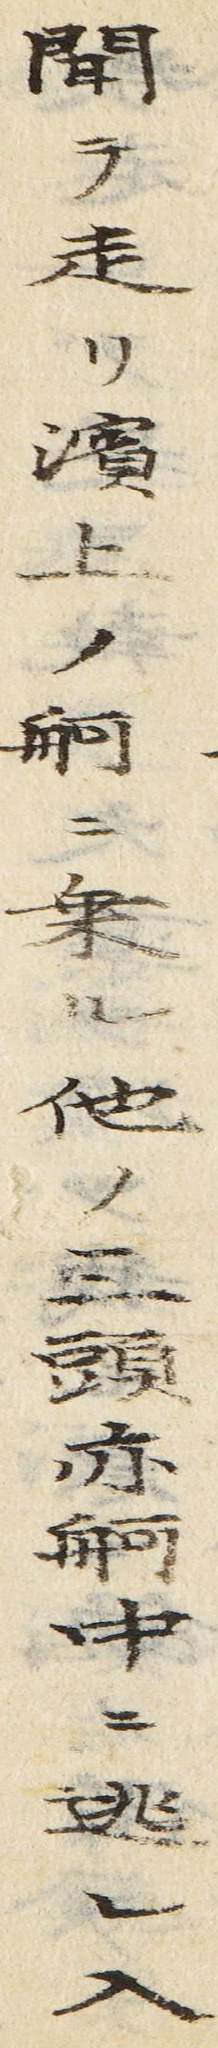聞テ走リ浜上ノ舸ニ乗ル他ノ三頭亦舸中ニ逃レ入
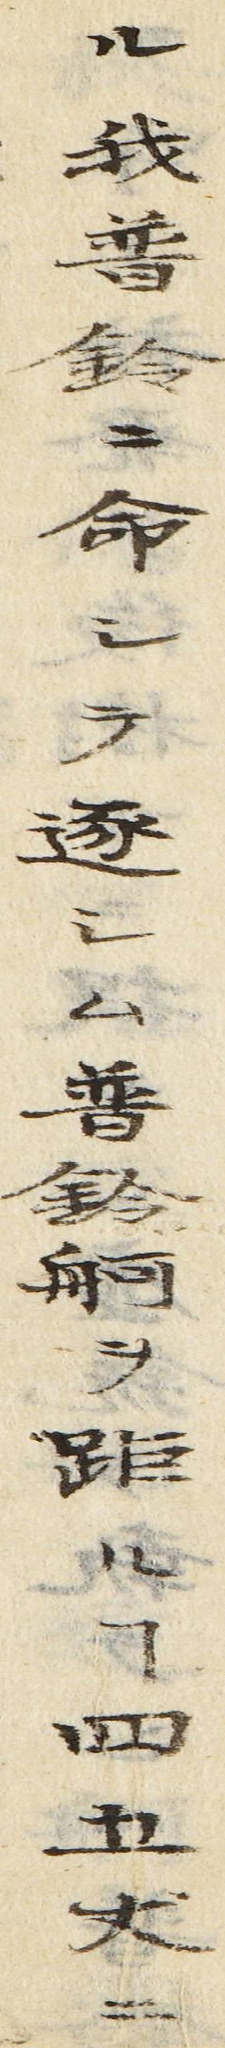ル我普鈴ニ命シテ逐シム普鈴舸ヲ距ルコト四五丈ニ
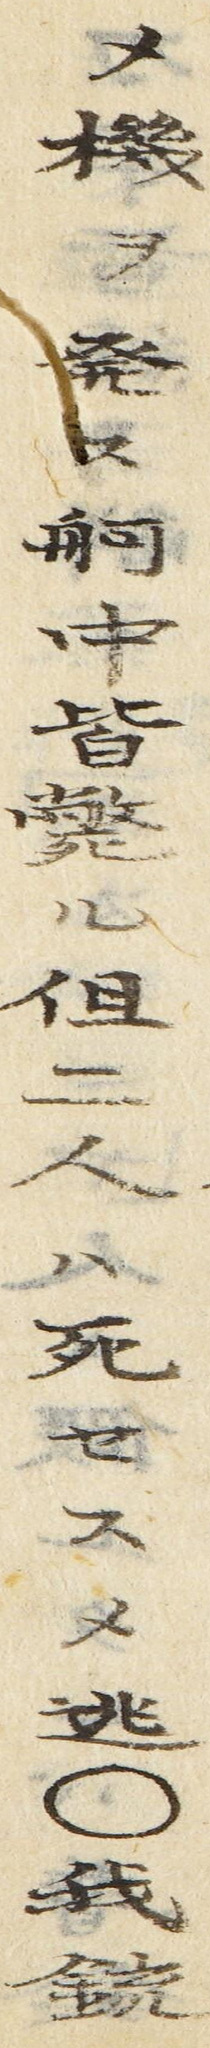シテ機ヲ発ス舸中皆斃ル但二人ハ死セスシテ逃◯我銃

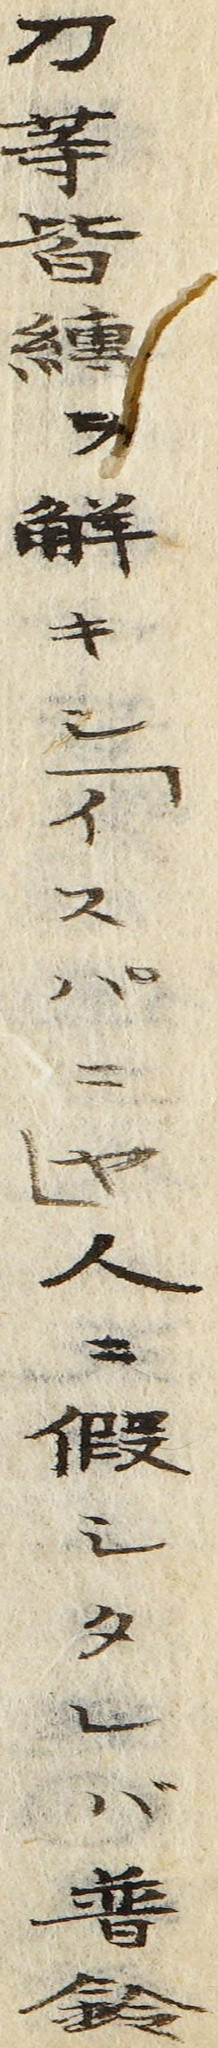刀等皆縛ヲ解キシ「イスパニヤ」人ニ仮シタレバ普鈴
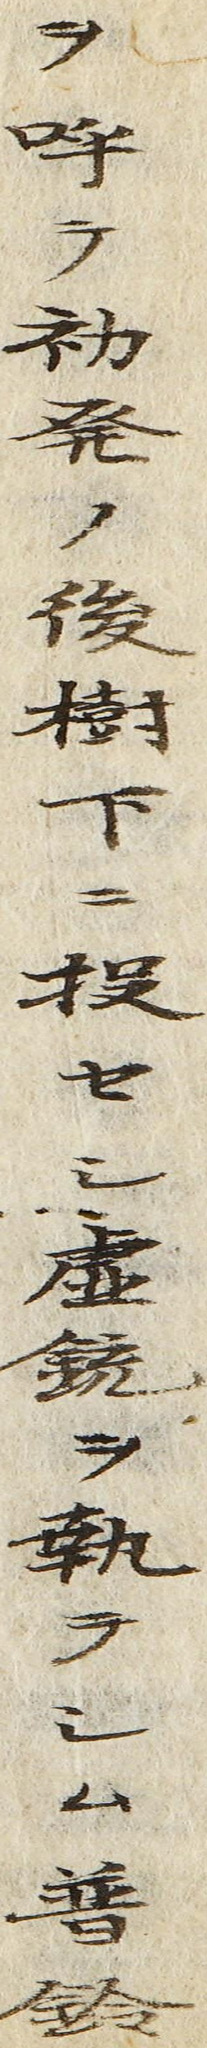ヲ呼テ初発ノ後樹下ニ投セシ虚銃ヲ執ラシム普鈴
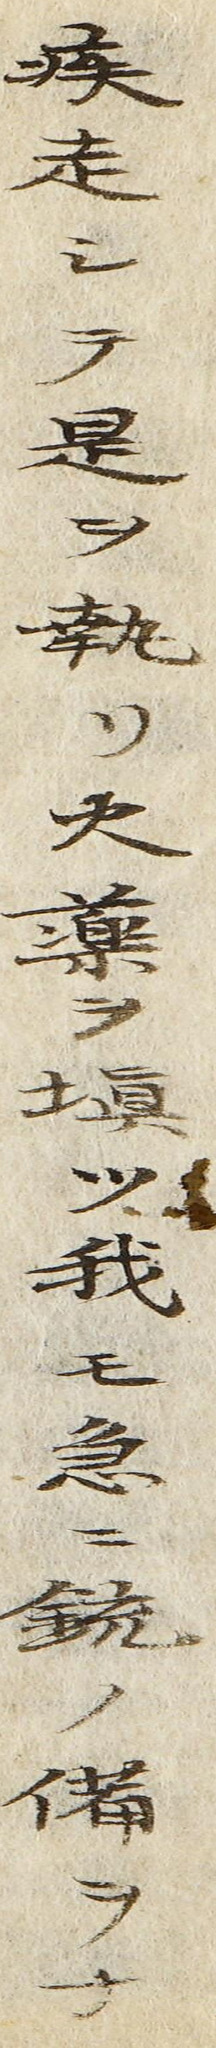疾走シテ是ヲ執リ火薬ヲ填ツ我モ急ニ銃ノ備ヲナ
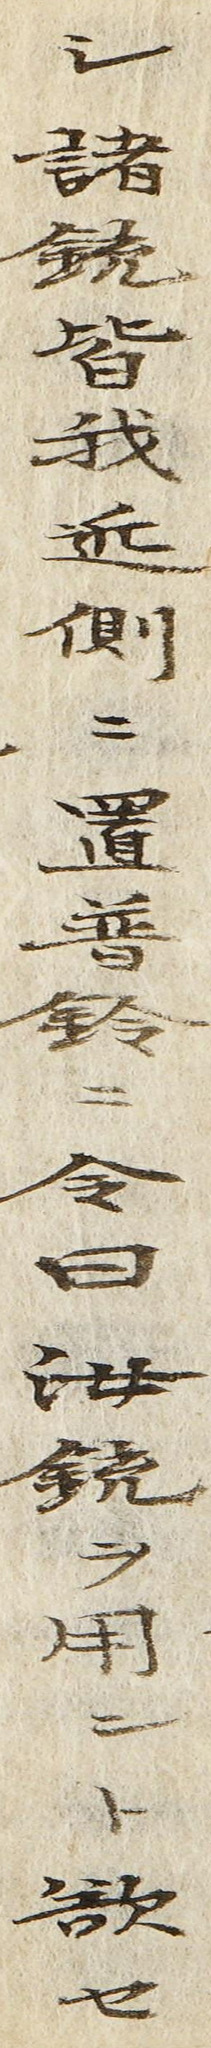シ諸銃皆我近側ニ置普鈴ニ令曰汝銃ヲ用ント欲セ
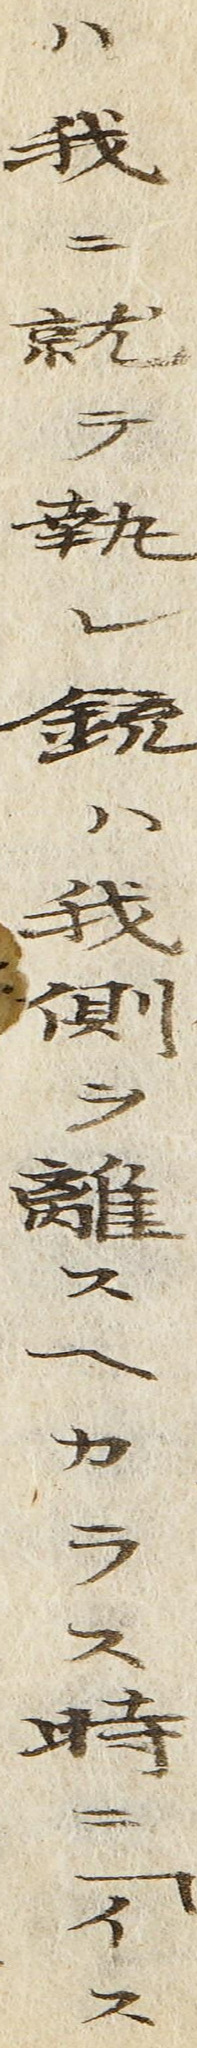ハ我ニ就テ執レ銃ハ我側ヲ離スヘカラス時ニ「イス
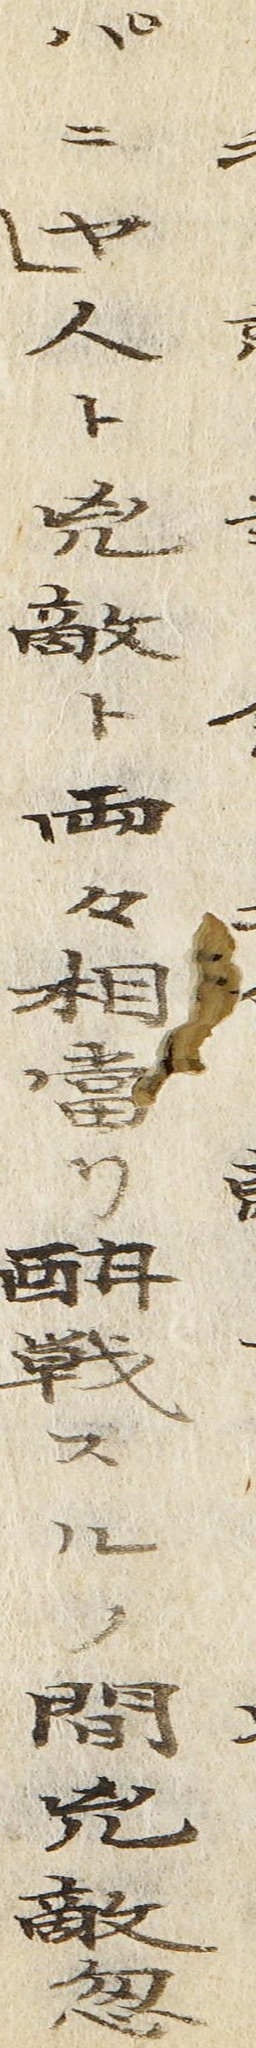パニヤ」人ト兇敵ト両々相当リ酣戦スルノ間兇敵忽
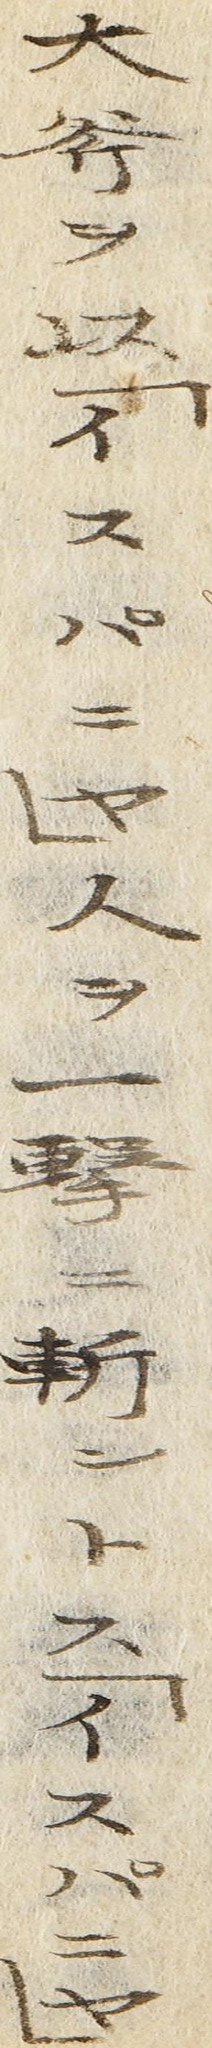大斧ヲ以「イスパニヤ」人ヲ一撃ニ斬ントス「イスパニヤ」
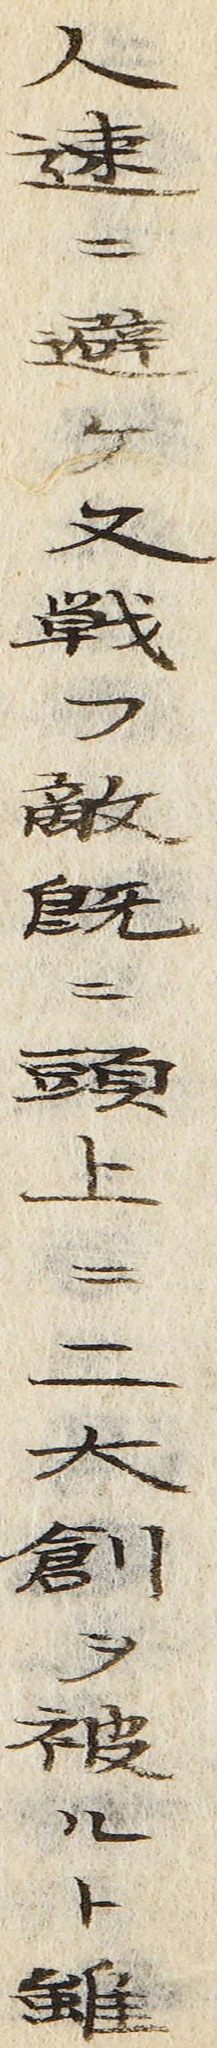人速ニ避ケ又戦フ敵既ニ頭上ニ二大創ヲ被ルト雖
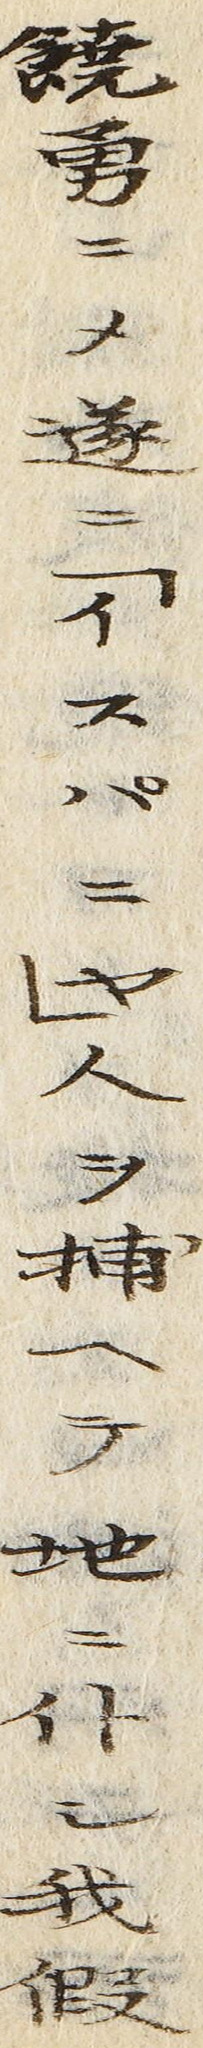饒勇ニシテ遂ニ「イスパニヤ」人ヲ捕ヘテ地ニ仆シ我仮
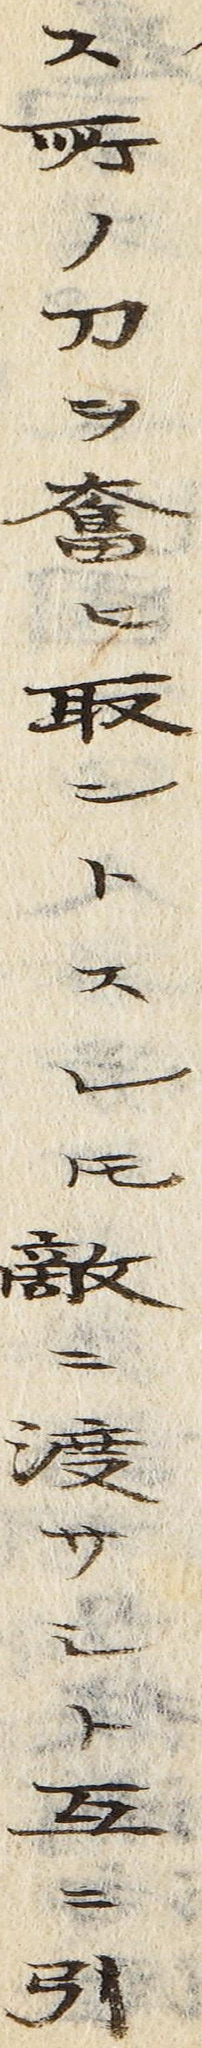ス所ノ刀ヲ奮ヒ取ントスレトモ敵ニ渡サシト互ニ引
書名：漂流紀事
